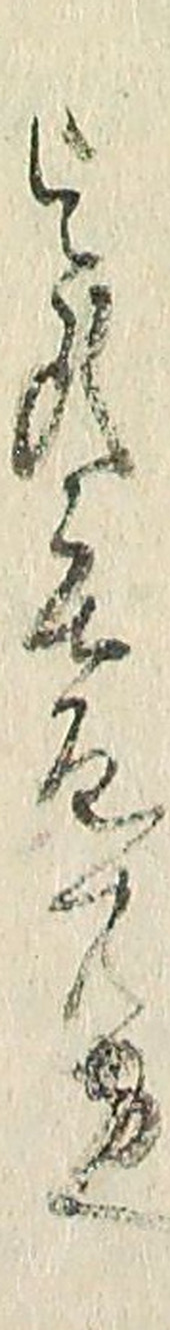与頭庄屋共方へ
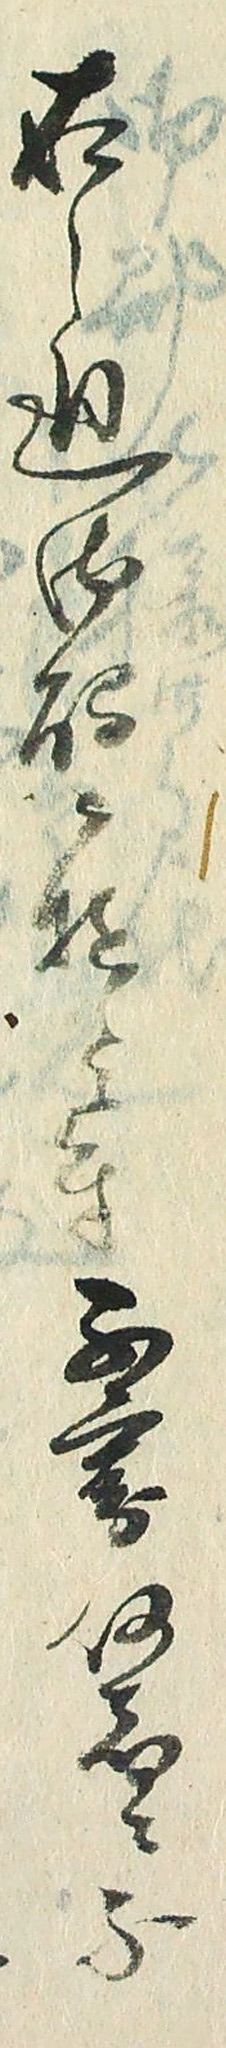右之通御触被遊候に付不寄何者に不
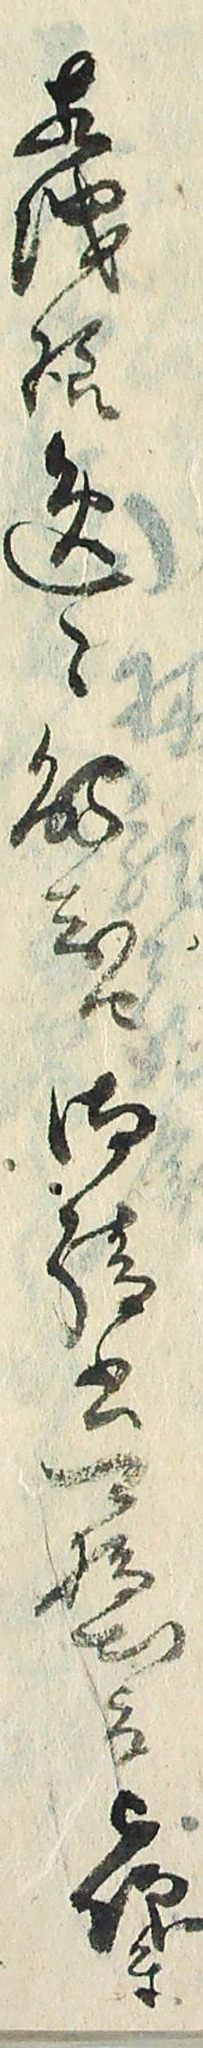相洩様逸々触知せ御請書可指出旨被仰付
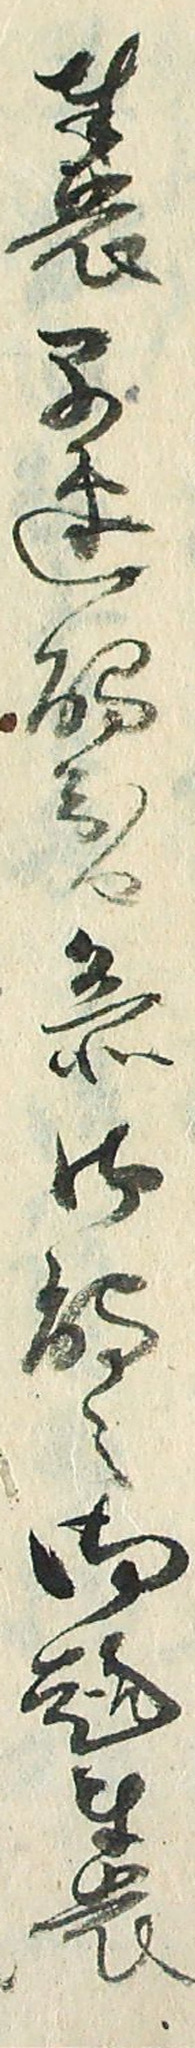奉畏早速触知せ候所御触之御趣奉畏
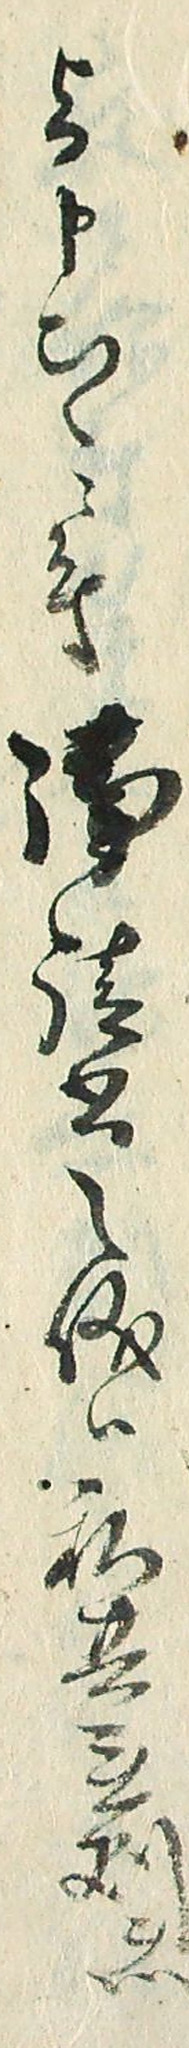旨申出候に付御請書之儀は私共連判を以

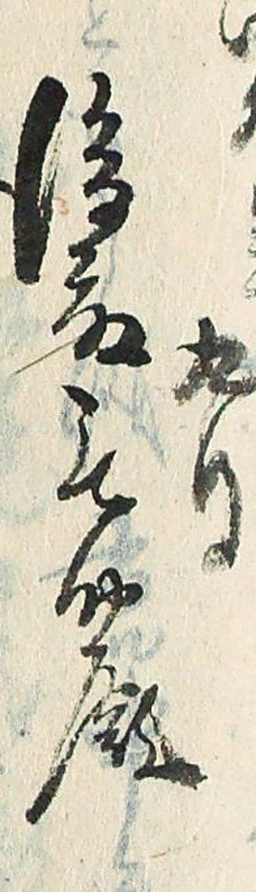後藤庄助殿
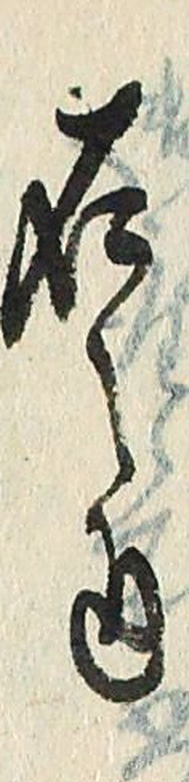右之通
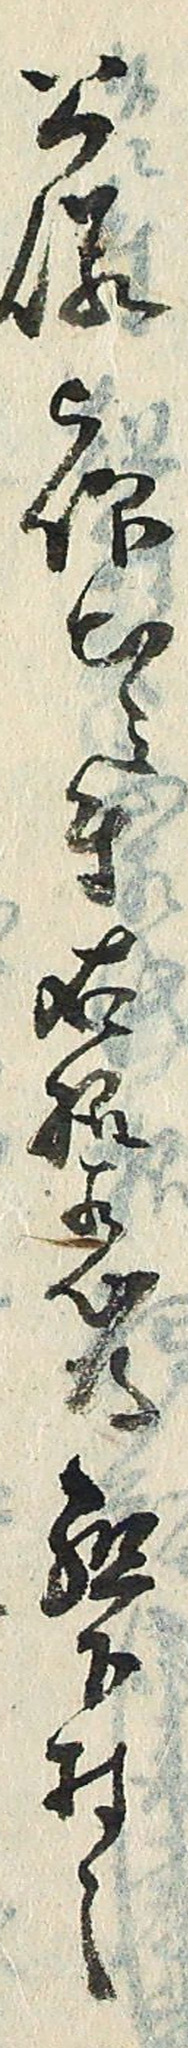公儀被仰出候に付右様相心得組下村々
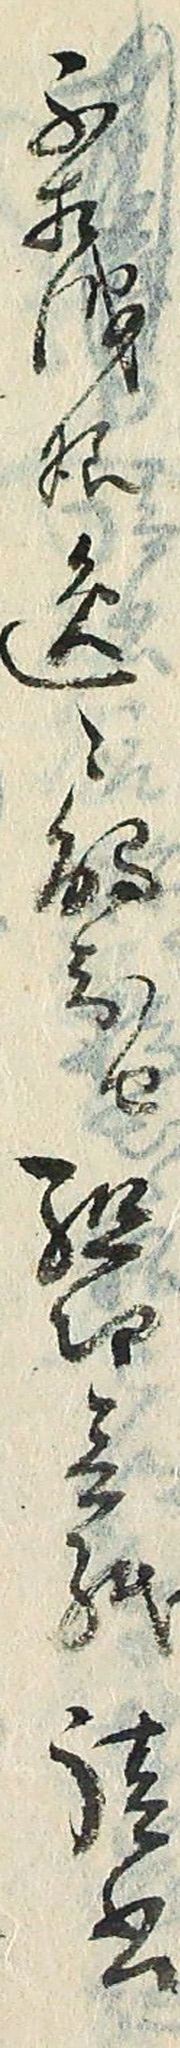不相洩様逸々触知せ組切壱紙請書
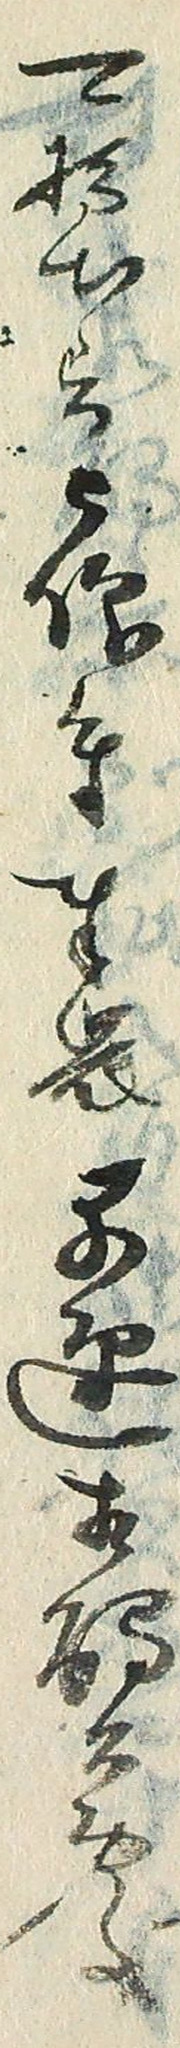可指出旨被仰付奉畏早速相触候処
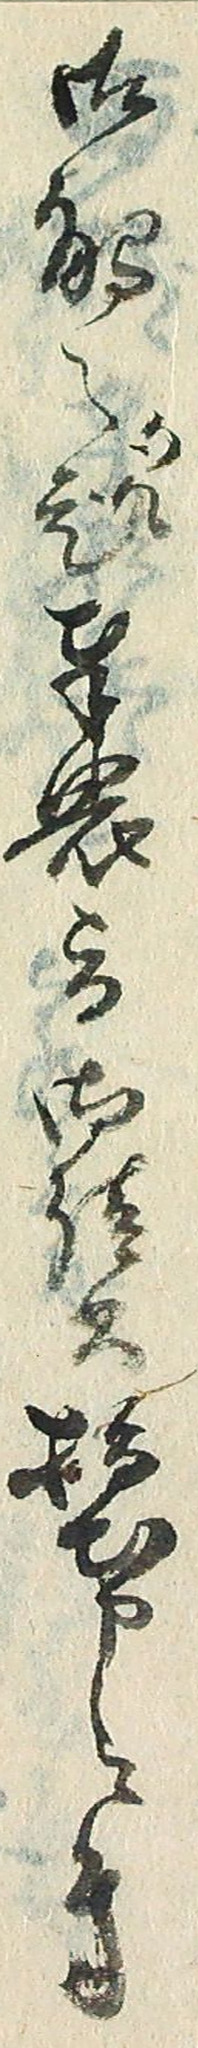御触之御趣奉畏旨御請書指出申に付
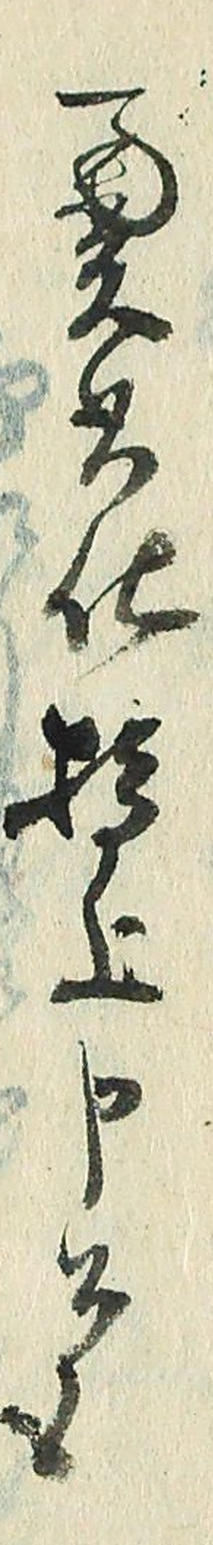奥書仕指上申候以上
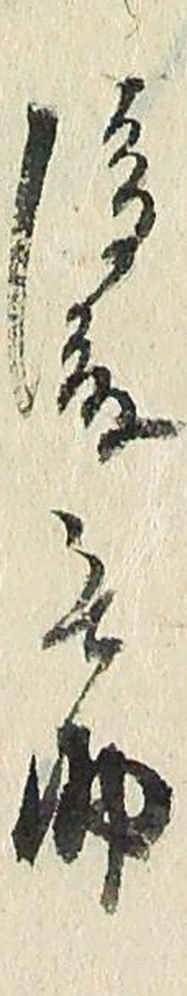後藤庄助
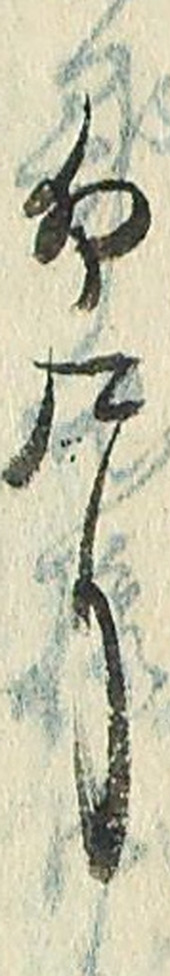卯九月
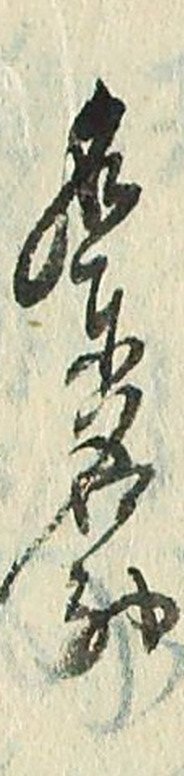名東名西
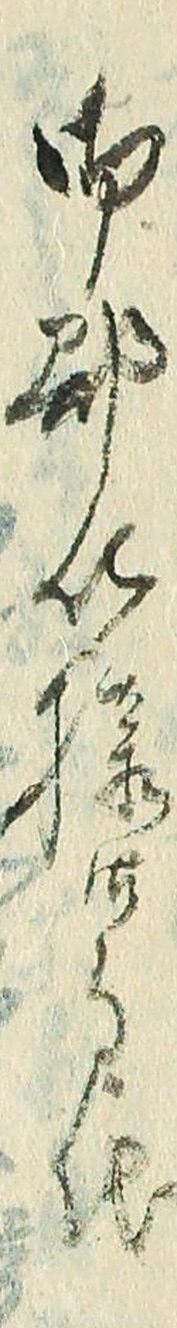御郡代様御手代
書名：諸御用御□受書控
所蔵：鳴門教育大学 Naruto University of Education
